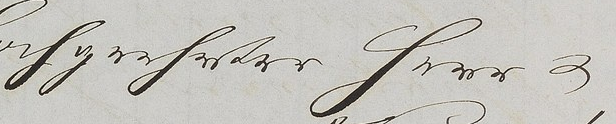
Hochgeehrter Herr &
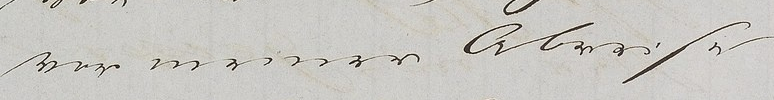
vor meiner Abreise
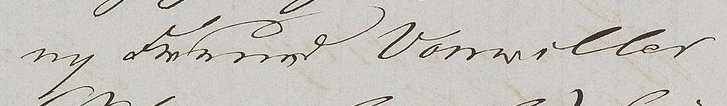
meinem Freund Vonwiller
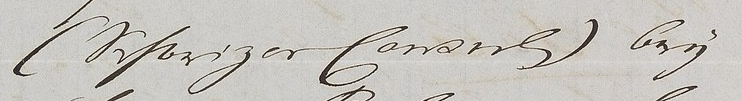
(Schweizer Consul) bey
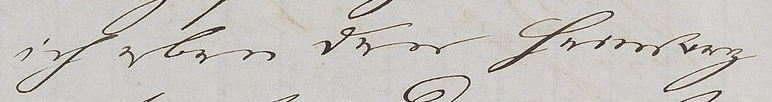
ich eben den Heimweg
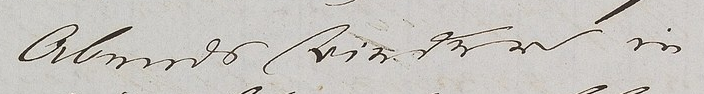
Abends wieder in
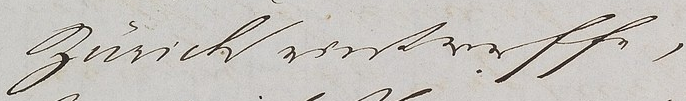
Zürich eintreffe,
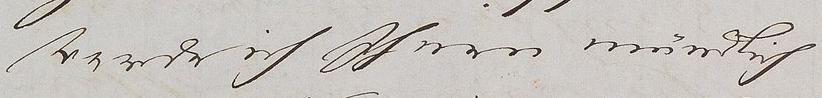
werde ich Ihnen mündlich
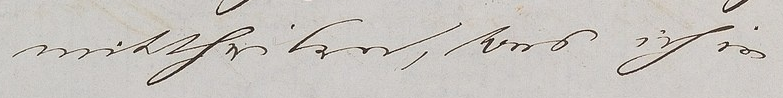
mittheilen, was ich in
